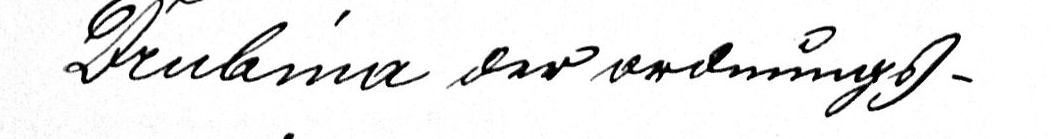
Drubina der ordnungs¬
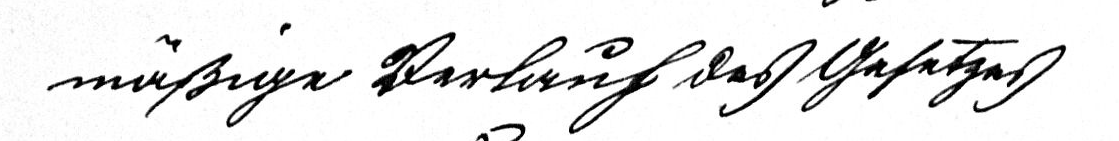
mäßige Verlauf des Gesetzes
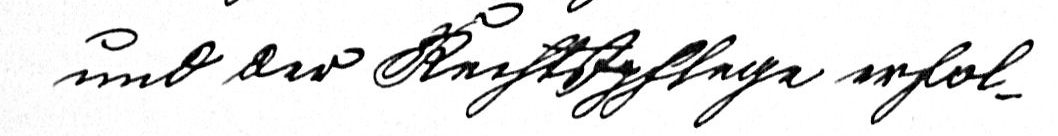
und der Rechtpflege erfol¬
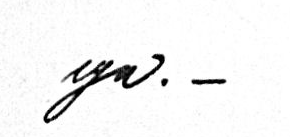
ge.-
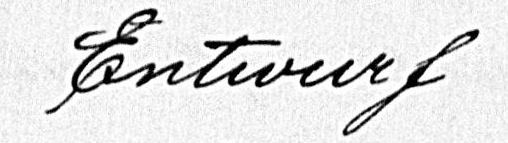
Entwurf
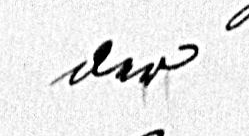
der
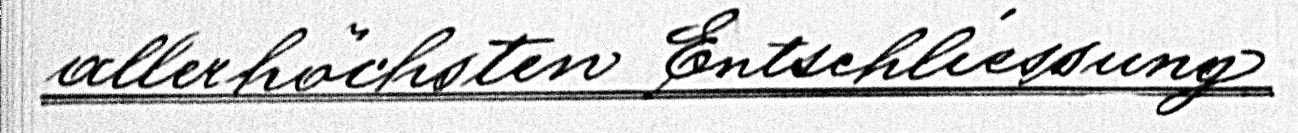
allerhöchsten Entschliessung
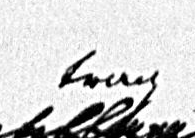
trag
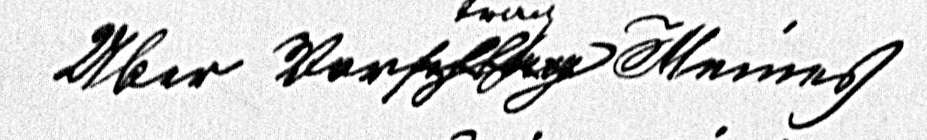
Über Vor Meines
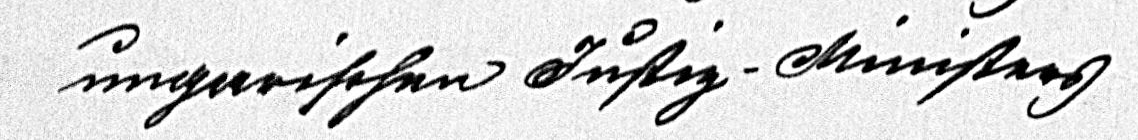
ungarischen Justiz - Ministers
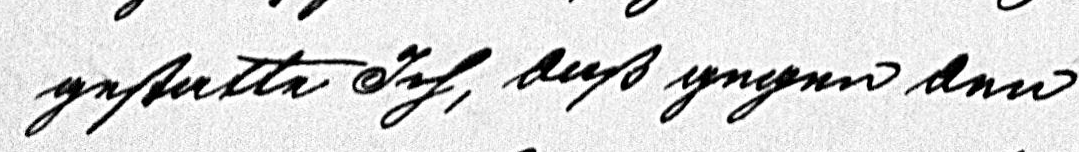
gestatte Ich, auß gegen den
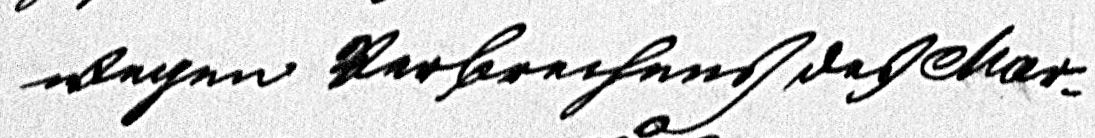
wegen Verbrechens des Mor¬
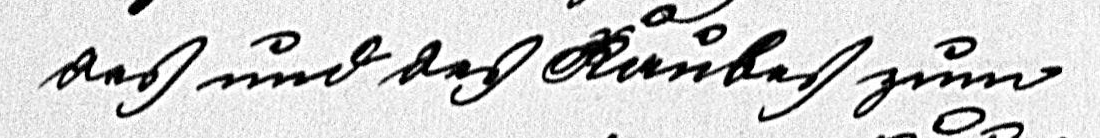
des und des Raubes zum
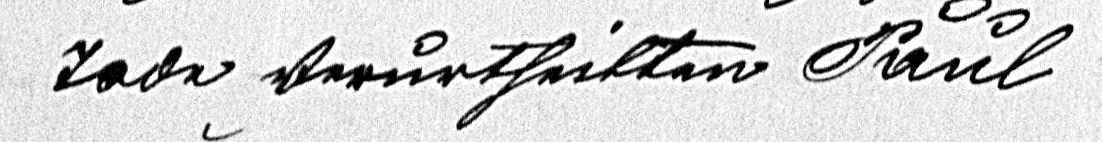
Tode verurtheilten Paul
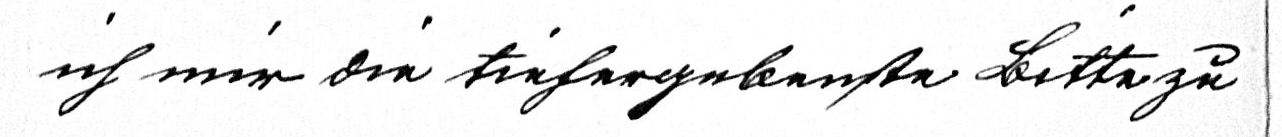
ich mir die tiefergebenste Bitte zu
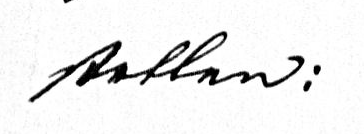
stellen:
